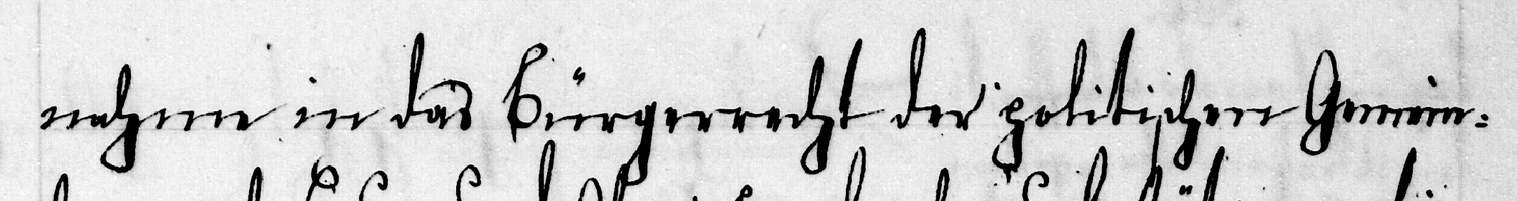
nahme in das Bürgerrecht der politischen Gemein¬
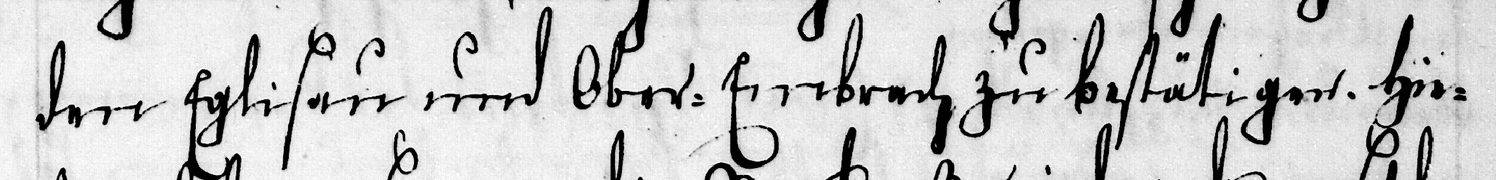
den Eglisau und Ober-Embrach zu bestätigen. Hie¬
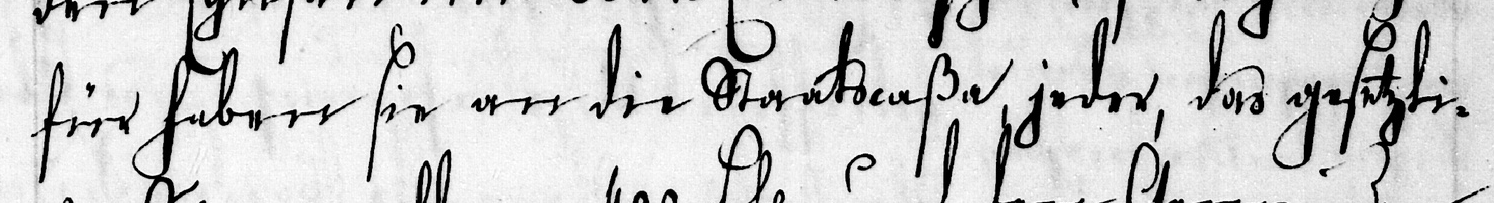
für haben sie an die Staatscaßa, jeder, das gesetzli¬
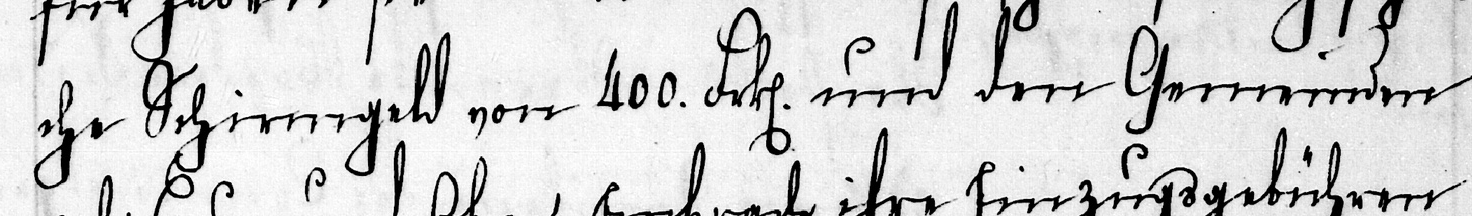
che Schirmgeld von 400. Frk[en]. und den Gemeinden
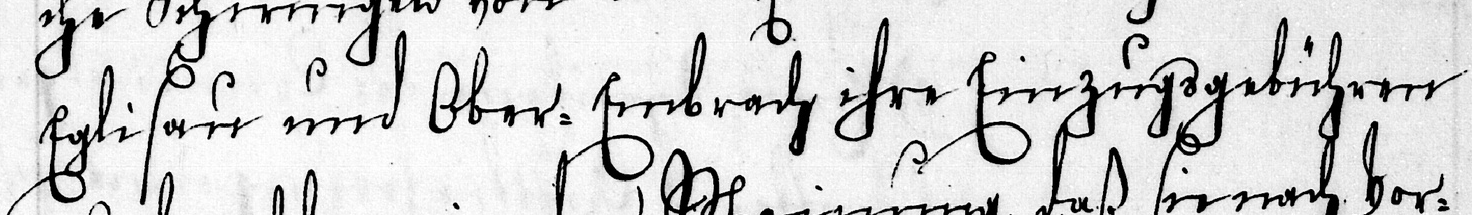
Eglisau und Ober-Embrach ihre Einzugsgebühren
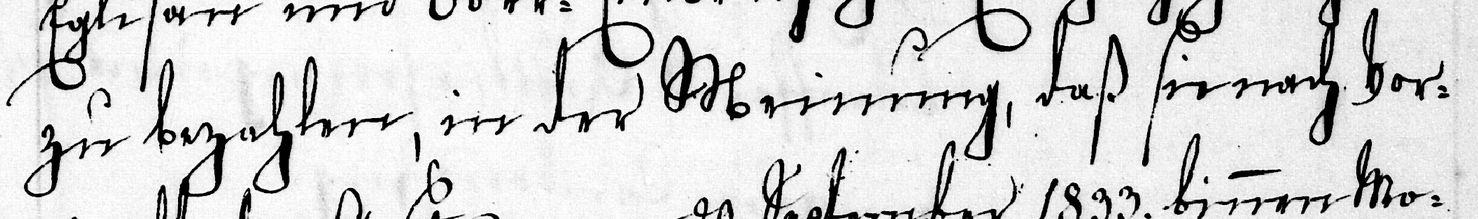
zu bezahlen, in der Meinung, daß sie nach Vor¬
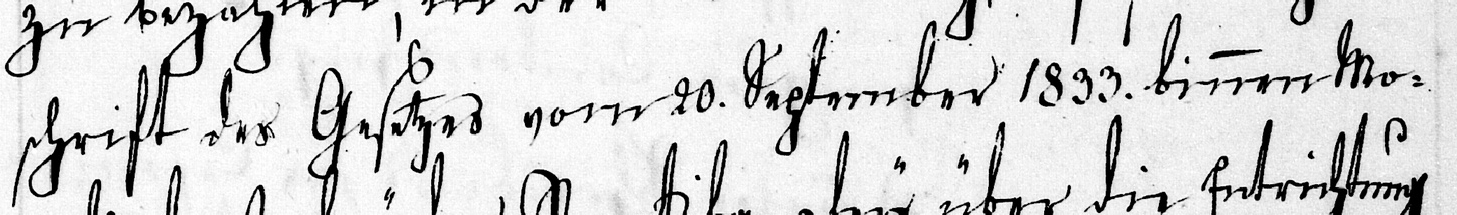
schrift des Gesetzes vom 20. September 1833. binnen Mo¬
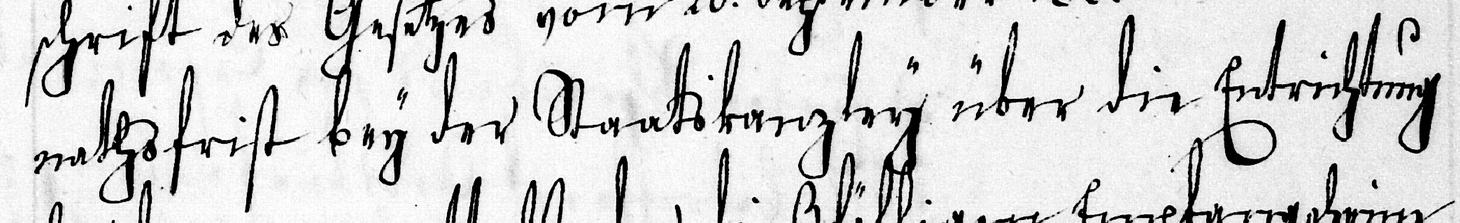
nathsfrist bey der Staatskanzley über die Entrichtung
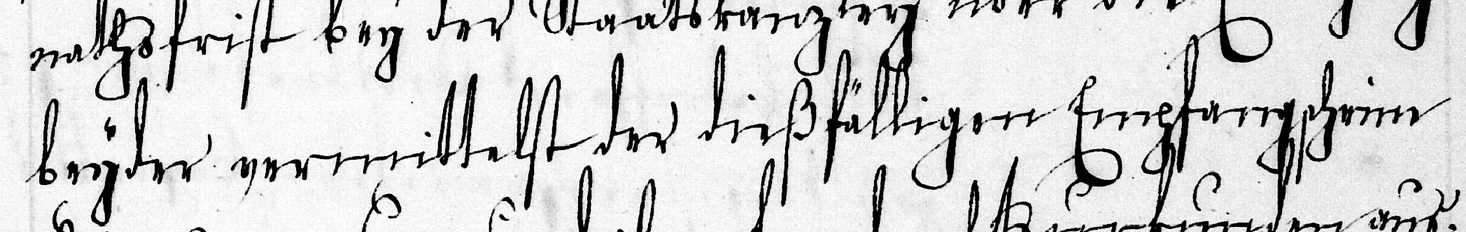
beyder vermittelst der dießfälligen Empfangscheine
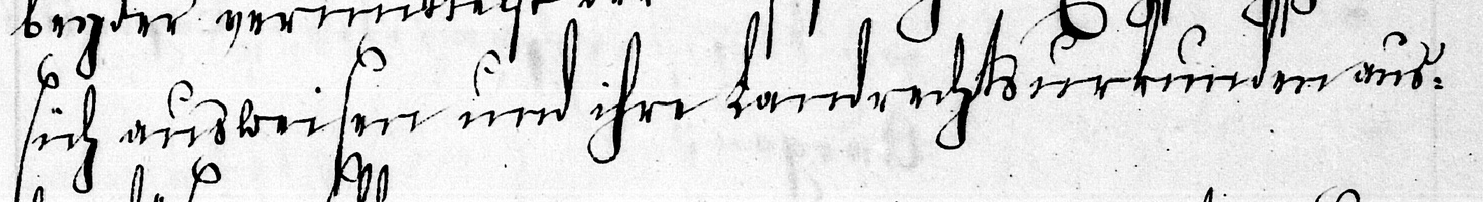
sich ausweisen und ihre Landrechtsurkunden aus¬
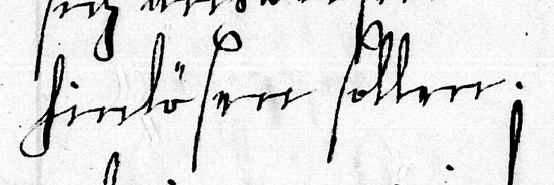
hinlösen sollen.
